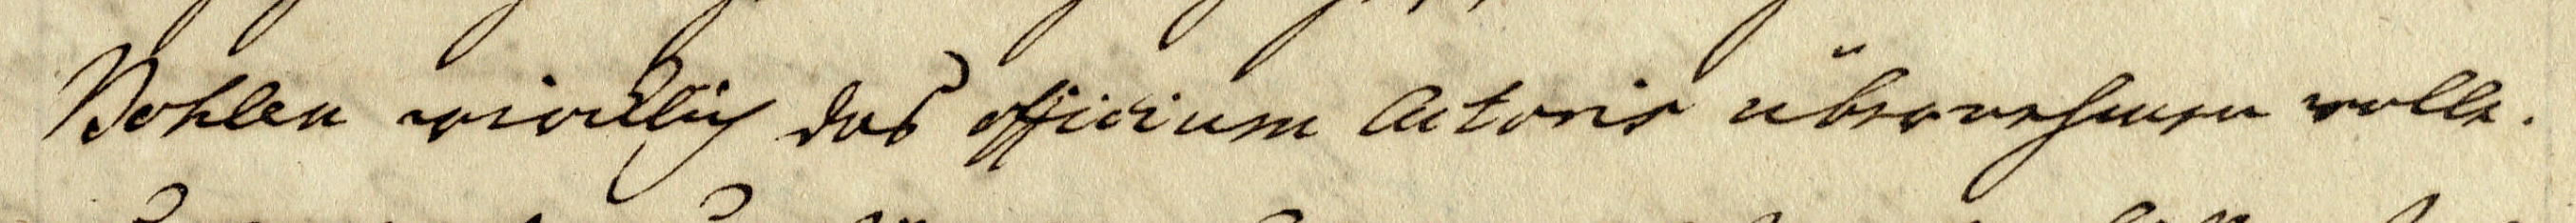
Bohlen wircklich das officium Actoris übernehmen wolle.
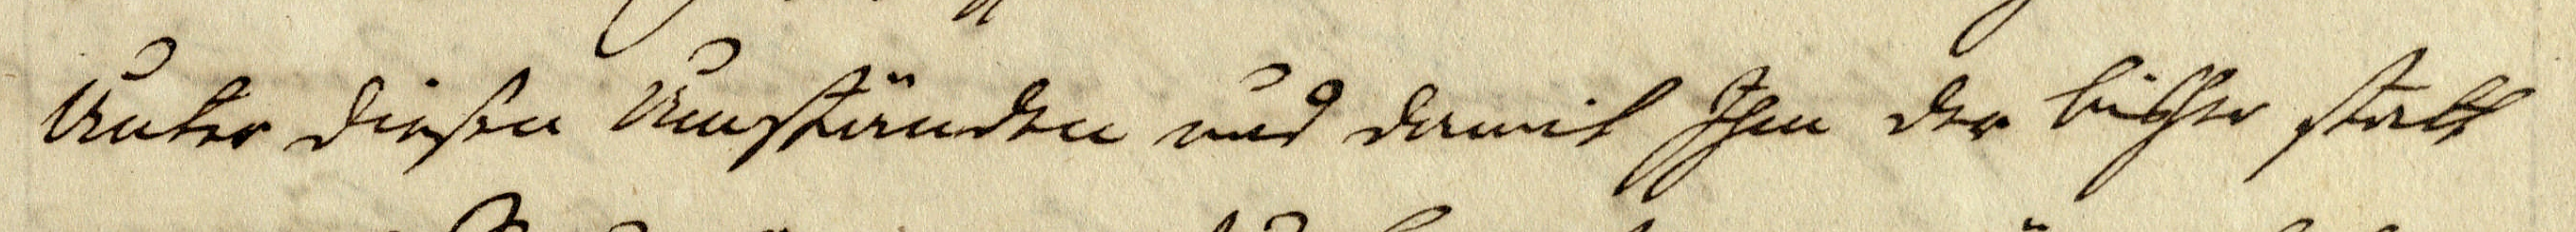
Unter diesen Umständen und damit Ihm der bisher statt
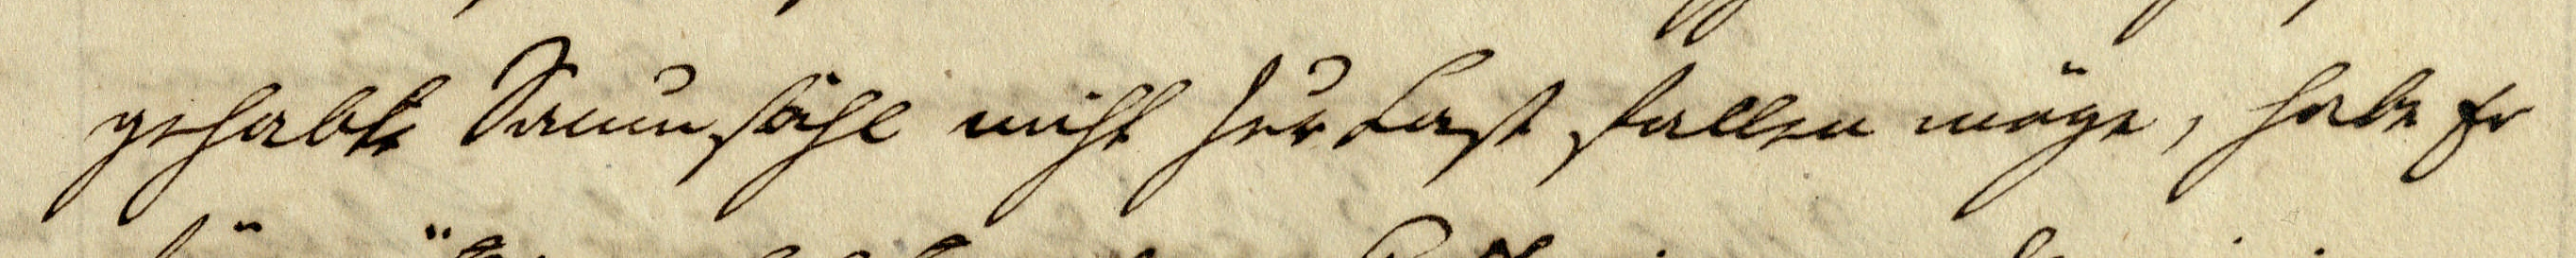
gehabte Saumsahl nicht zur Last fallen möge, habe Er
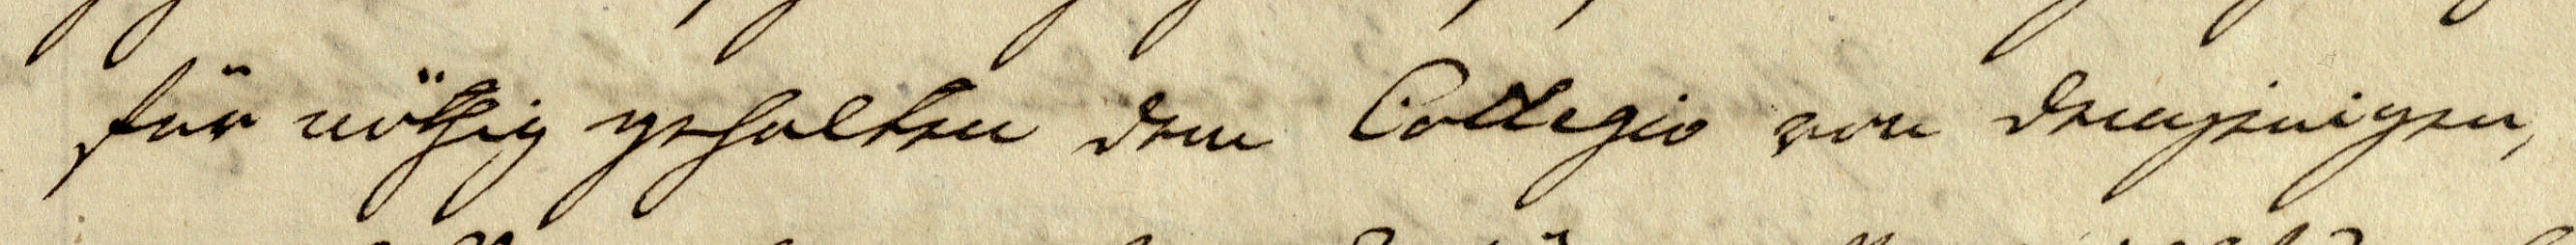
für nöthig gehalten dem Collegio von demjenigen,
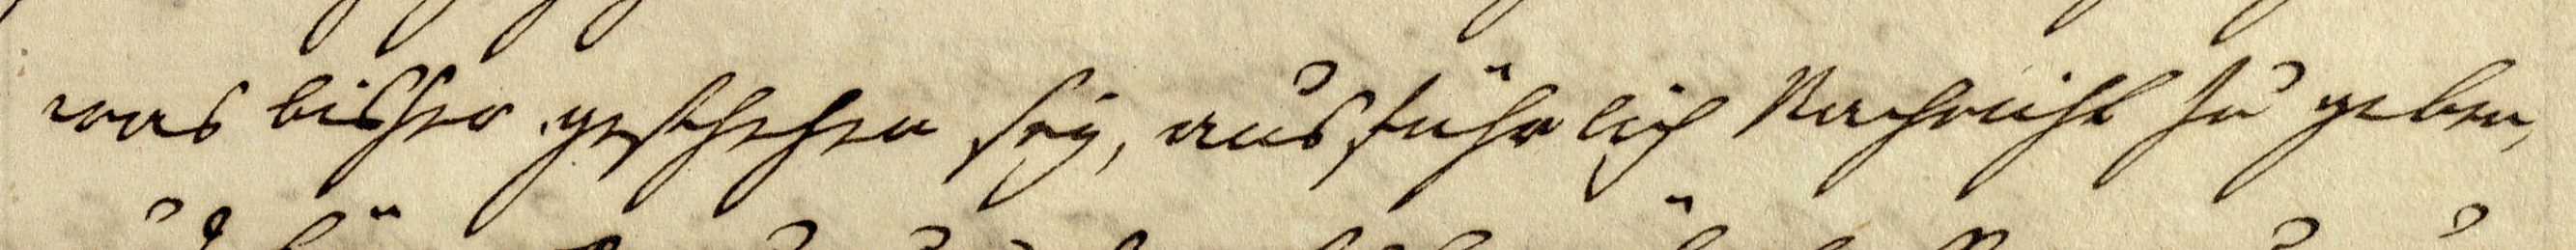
was bisher geschehen seÿ, ausführlich Nachricht zu geben,
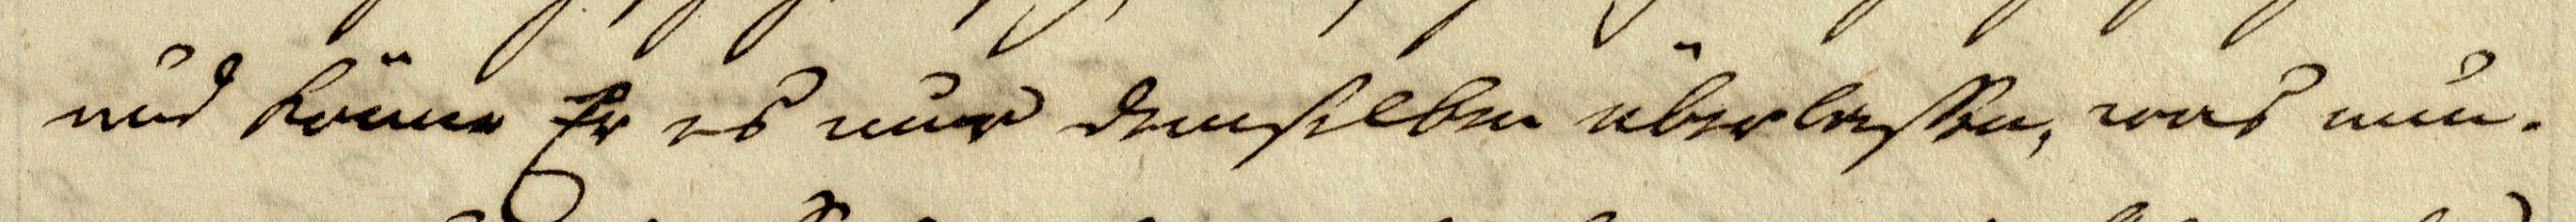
und könne Er es nur demselben überlassen, was nun¬
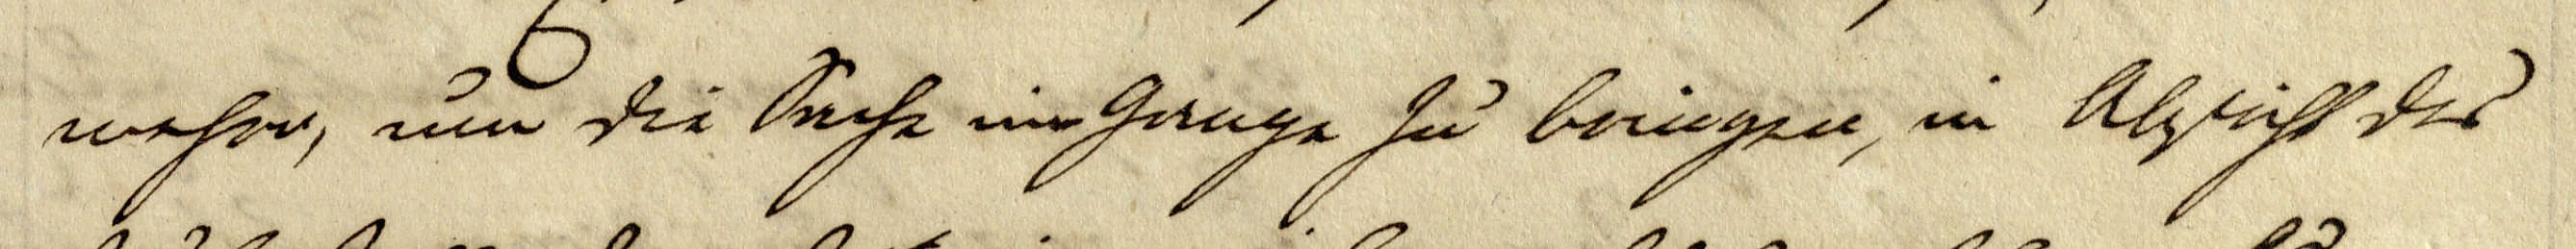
mehro, um die Sache in Gange zu bringen, in Absicht des
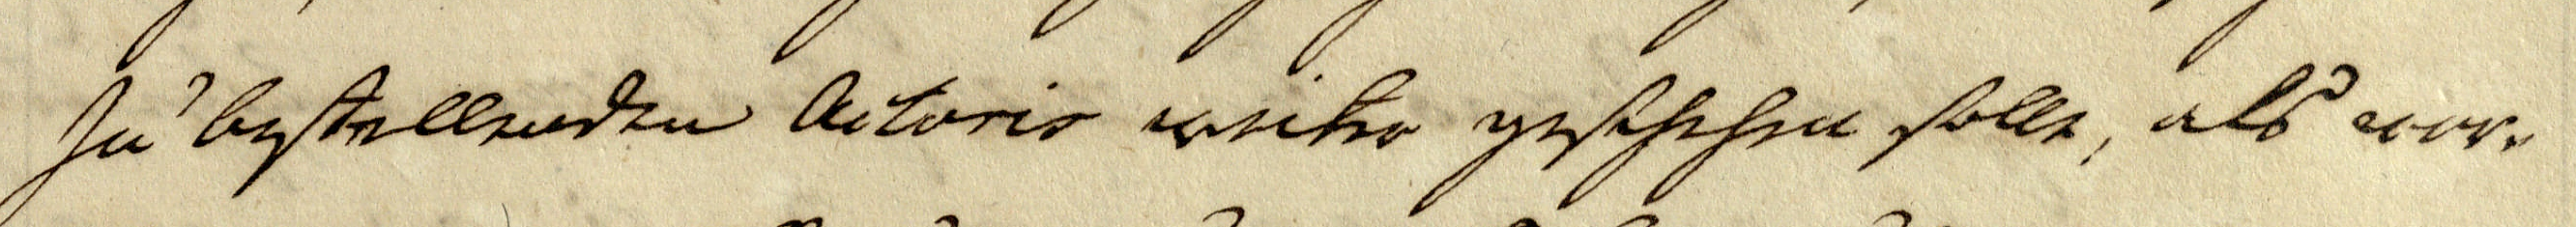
zu bestellenden Actoris weiter geschehen solle, als wor¬
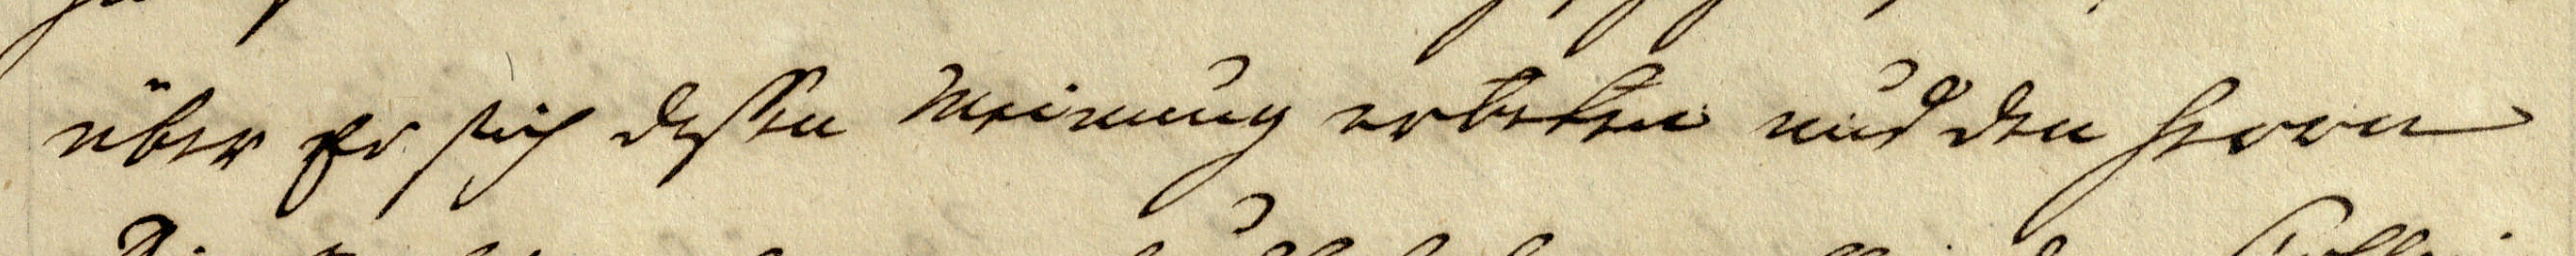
über Er sich dessen Meinung erbeten und den Herrn
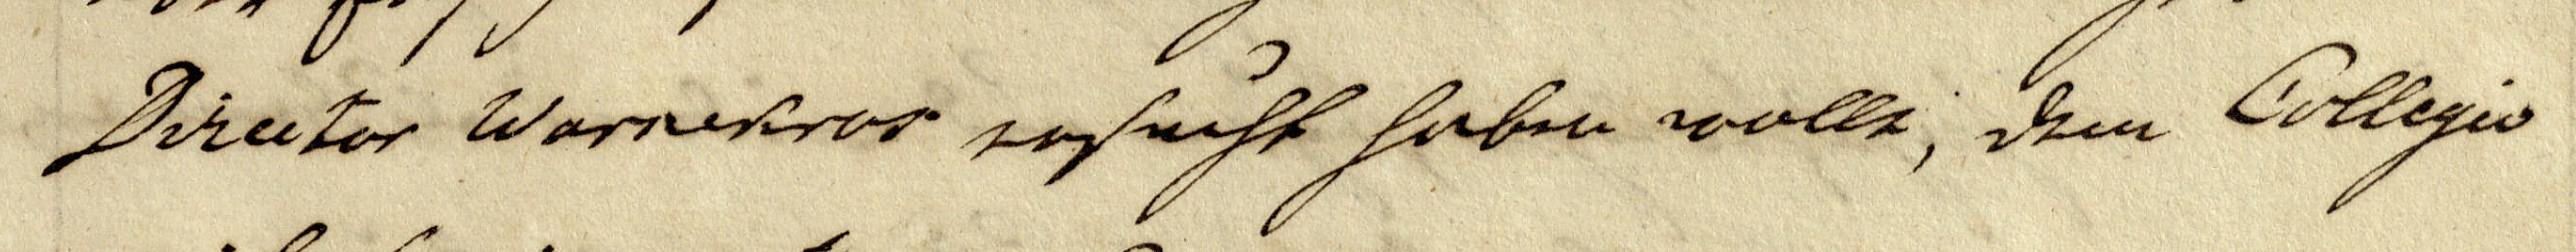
Director Warnekros ersucht haben wolle, dem Collegio
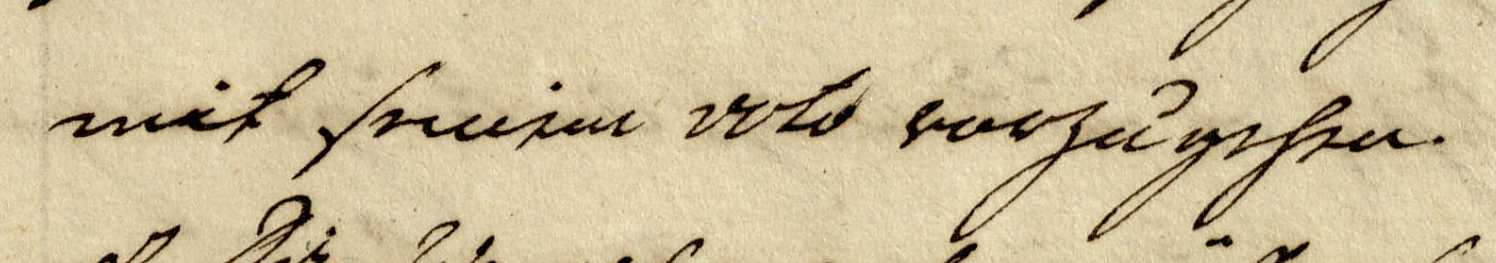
mit seinem voto vorzugehen
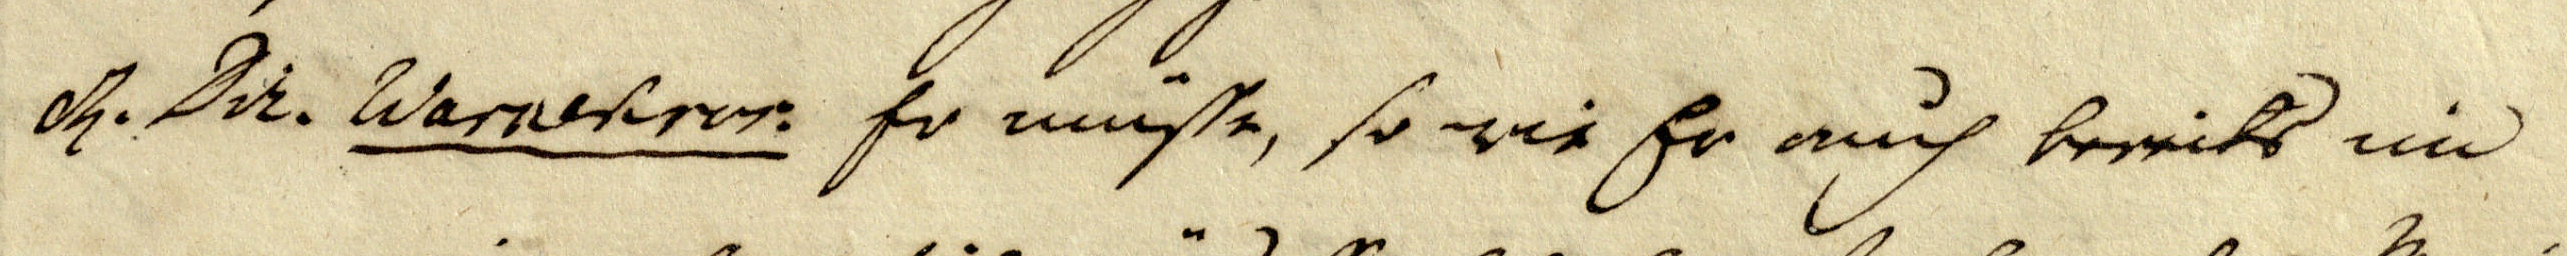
dh. Dir. Warnekros. Er müsse, so wie Er auch bereits im
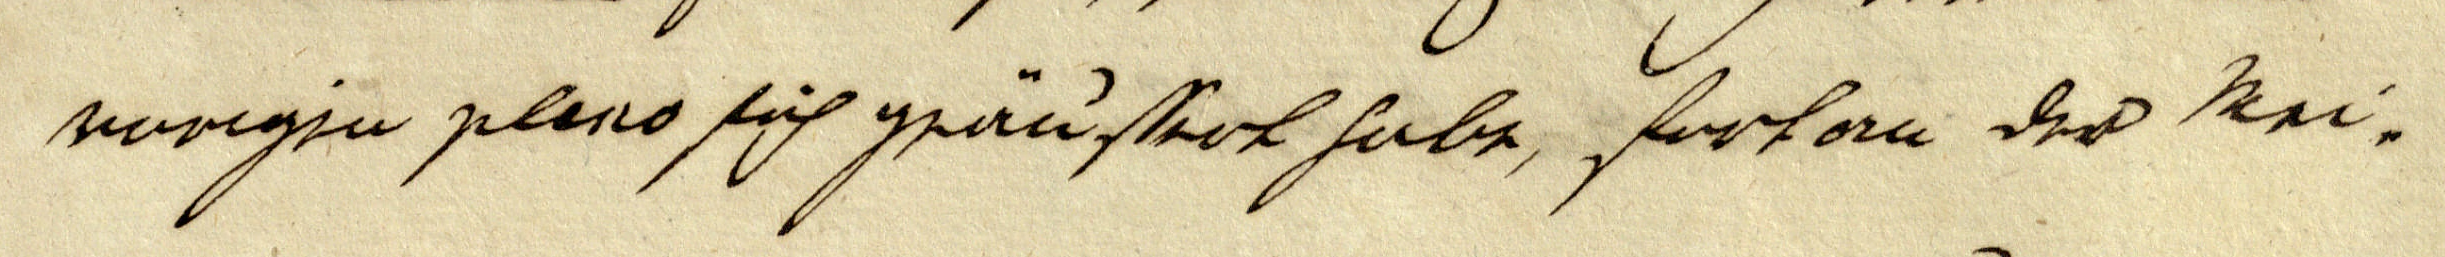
vorigen pleno sich geäussert habe, fortan der Mei¬
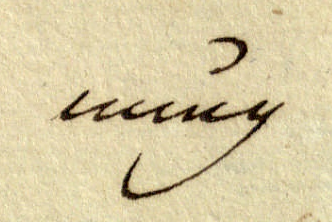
nung
